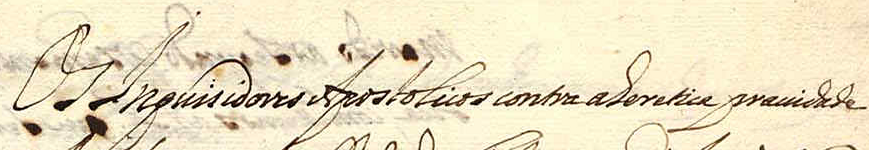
Os Inquisidores Apostolicos contra a heretica prauidade
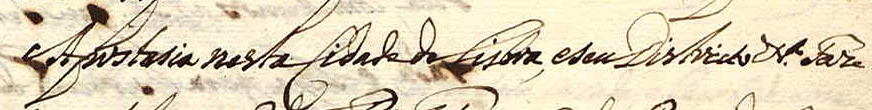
Apostasia nesta Cidade de Lisboa, e seu Districto &.a Faze
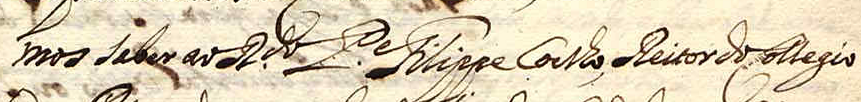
mos saber ao R.do Pe Filippe Coelho, Reitor do Collegio
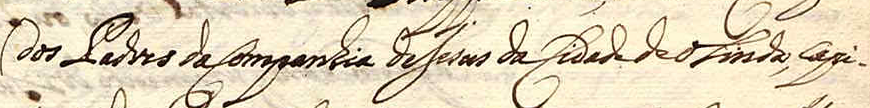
dos Padres da Companhia de Jesus da Cidade de olinda, capi
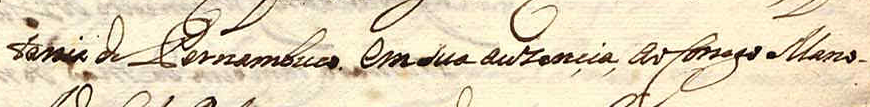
tania de Pernambuco. em sua auzencia, ao Conego Mano
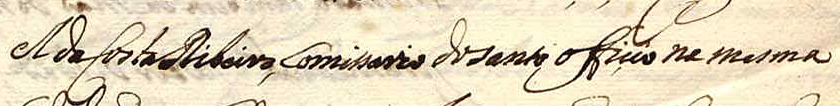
el da Costa Ribeiro, Comissario do santo officio na mesma
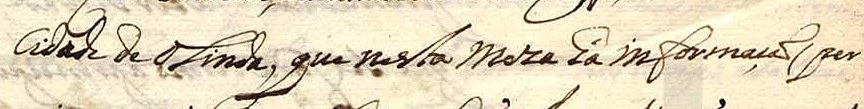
cidade de olinda, que nesta Meza há informaçaõ per
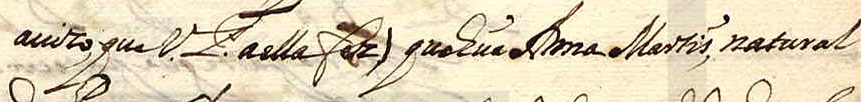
auizo, que V. P. a ella fez, que hūa Anna Martis̄, natural
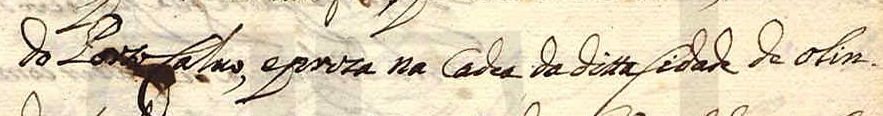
do Porto Caluo, e preza na cadea da dita Cidade de olin
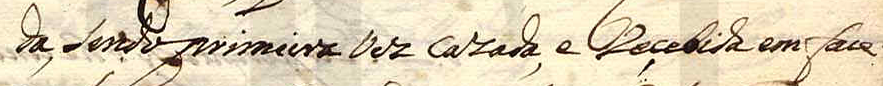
da, sendo primeira vez cazada, e Recebida em face
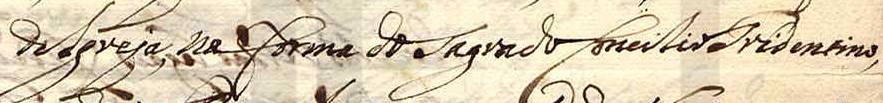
de Igreja, na forma do Sagrado Concilio Tridentino,
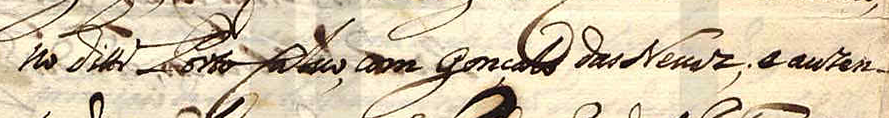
no ditto Porto Caluo, com gonçalo das Neuez, e auzen
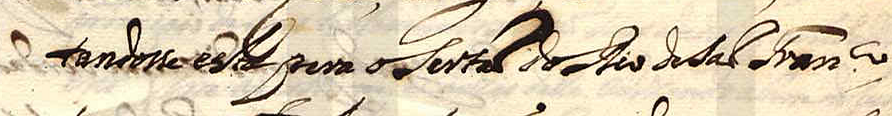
tandosse este pera o Sertaõ do Rio de Saõ Fran.co
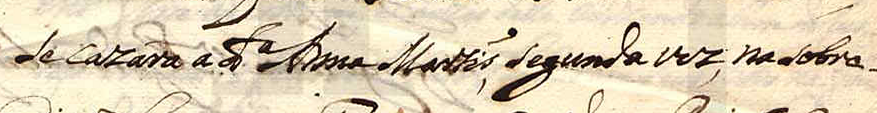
se cazara a d̄a Anna Martis̄, segunda vez, na sobre
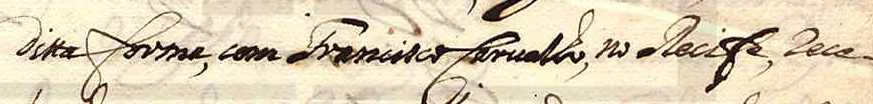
ditta forma, com Francisco Carualho, no Recife, Rece
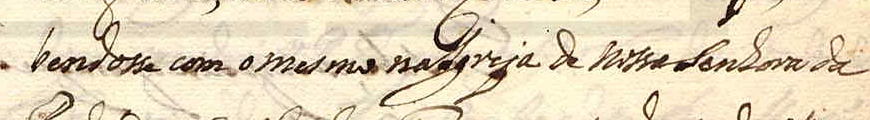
bendosse com o mesmo na Igreja de nossa Senhora da
